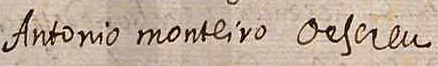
Antonio monteiro O escreui
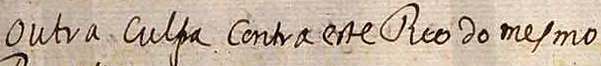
Outra culpa contra este Reo do mesmo
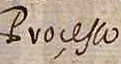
Processo
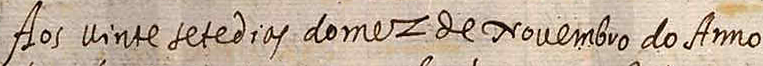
Aos uinte sete dias do mez de Nouembro do Anno
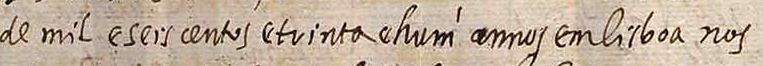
de miL e seiscentos e trinta e hum̄ annos em lisboa nos
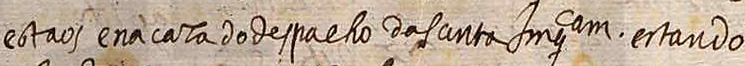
estaos e na caza do despacho da santa Jmqçam. estando
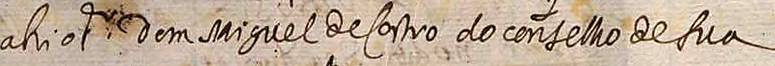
ahi o sor. dom Miguel de Castro do conselho de sua
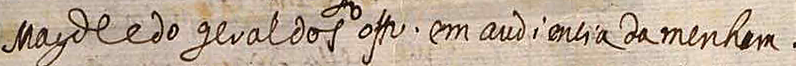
Magde e do geral do sto offo. em audiencia da menham.
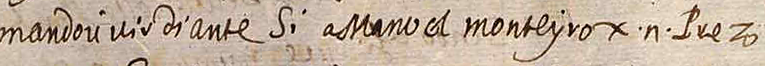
mandou uir diante Si a Manoel monteyro x. n. Prezo
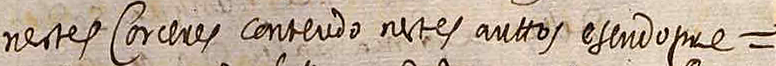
nestes Carceres conteudo nestes auttos e sendo pre
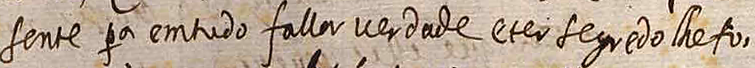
sente ꝑa em tudo fallar uerdade e ter segredo lhe foi
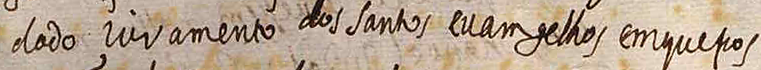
dado iuramento dos santos euamgelhos em que pos
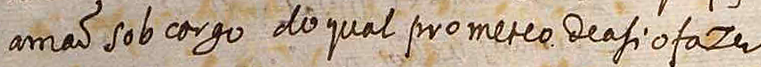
a maõ sob cargo do qual prometeo de asi o fazer
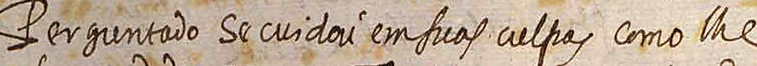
Perguntado se cuidou em suas culpas como lhe
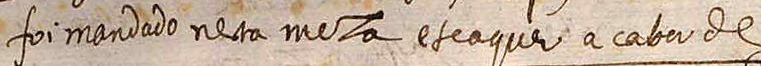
foi mandado nesta meza e se o quer acabar de
